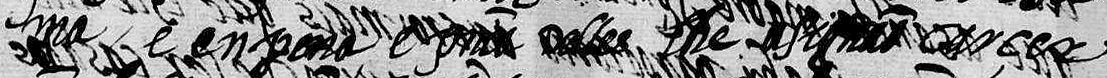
ma / e en pena e pnīa delles lhe asignaõ carcer
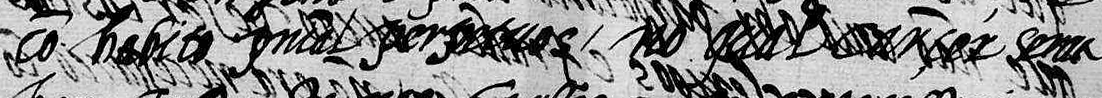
cō habito pnīal perpetuos no qual carcer seria
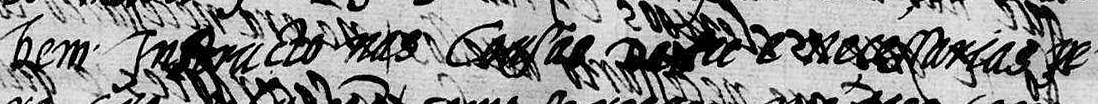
bem Jnstructo nas Cousas da fee e necessarias pe
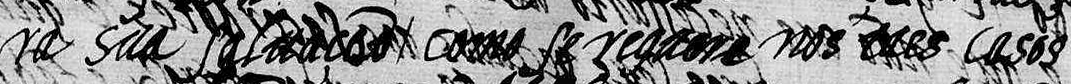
ra sua saluação / como se requere nos taes casos
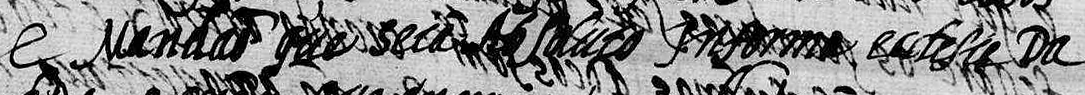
e Mandaõ que seia Absoluto Jn forma ecclesiæ Da
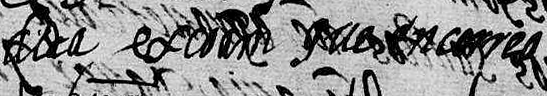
dita excoām que encorreo /
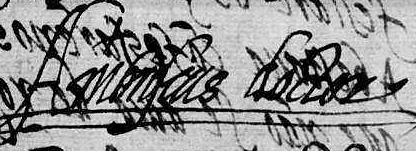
Ambrosius doctor
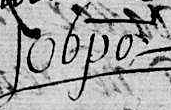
O bp̄o
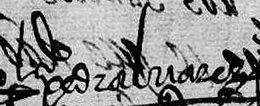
Ldo pedraluarez
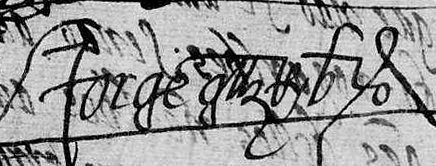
Jorge gllz̄ Rybro
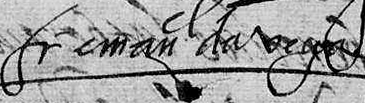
fr emanel da veiga
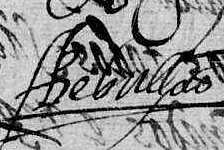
bullaõ
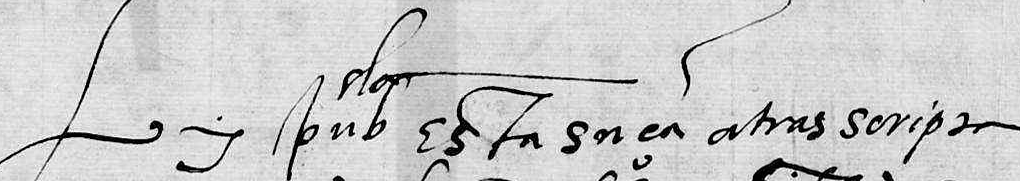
foy pubda Esta snçā atras scripta
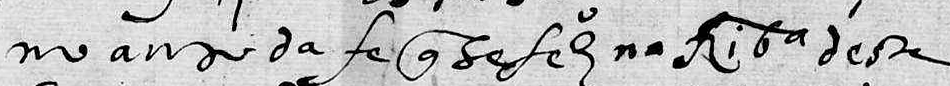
no auto da fe q̄ se fez na Rib̄a desta
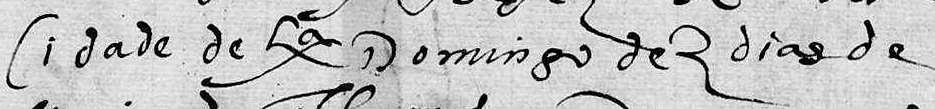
Cidade de LXa Domingo dez dias de
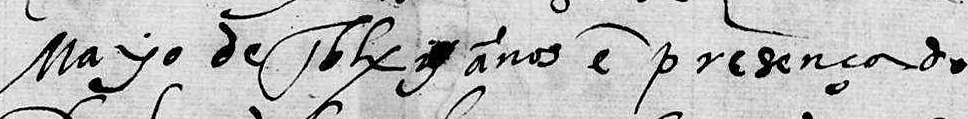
Mayo de j̄ blxij an̄os ē presença do
